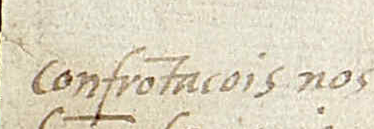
confrōtaçois nos
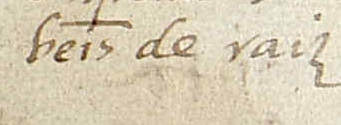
bēis de raiz
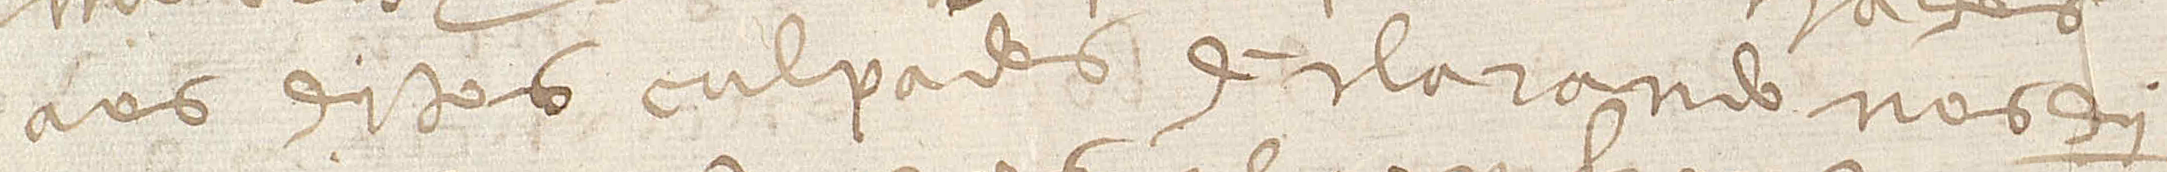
aos dytos culpados declarando nos dy
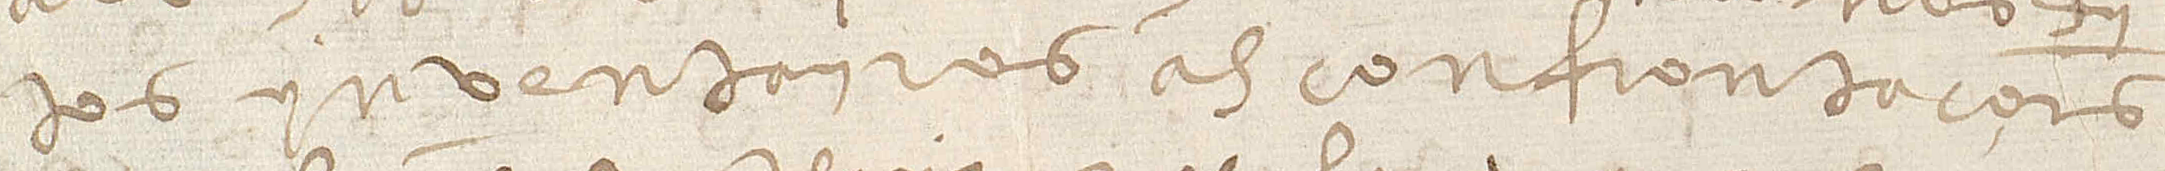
tos ynventayros as confrontações
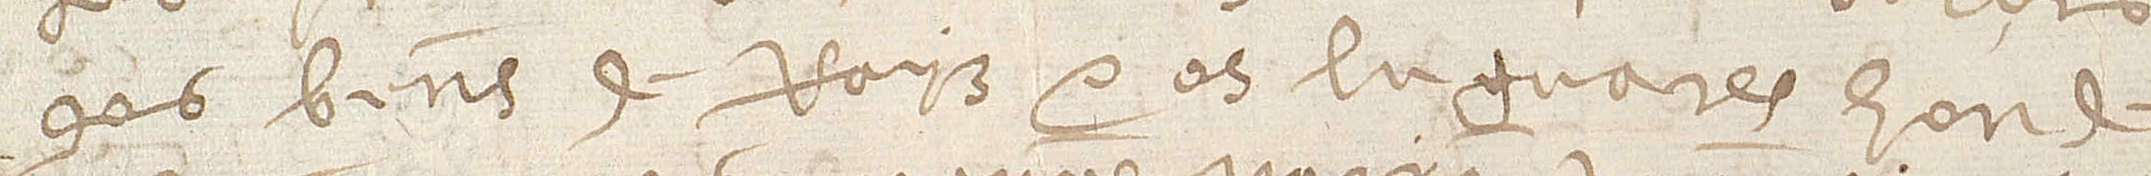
dos ben̄s de Rayz e os luguares honde
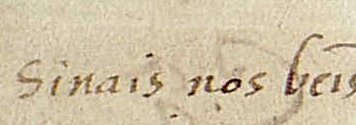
Sinais nos bēis
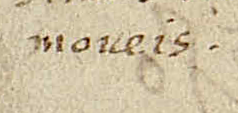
moueis.
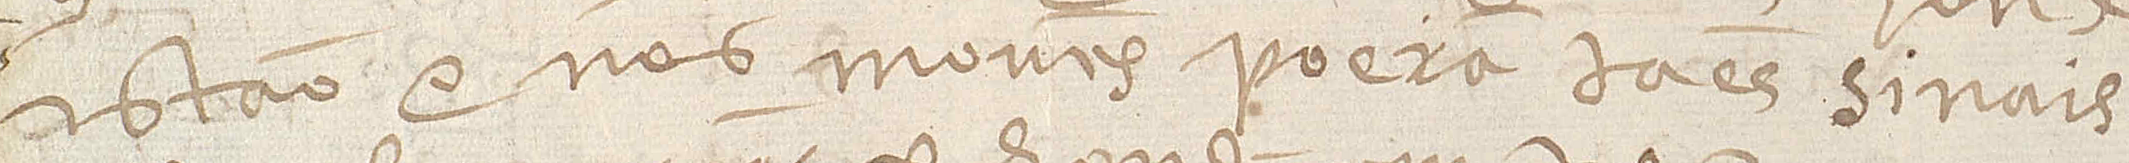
estão e nos mouēs poerā taēs sinais
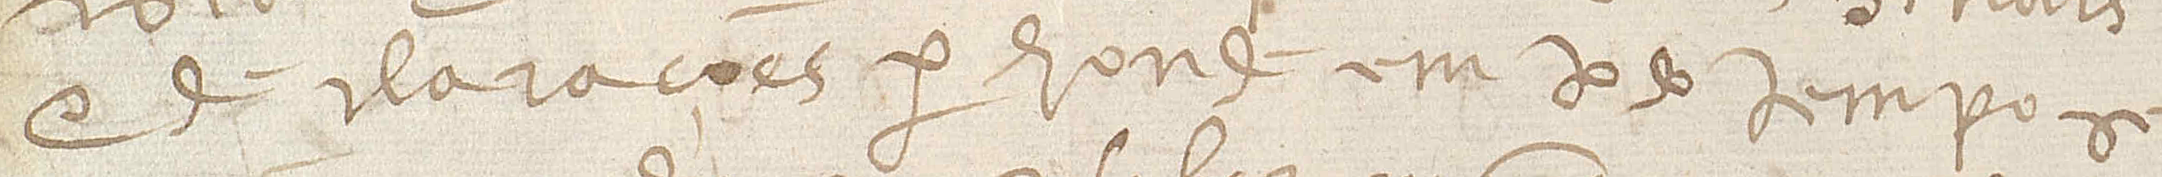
e declaraçoẽs ꝑ honde em todo tempo se
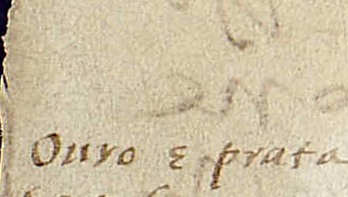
Ouro E prata
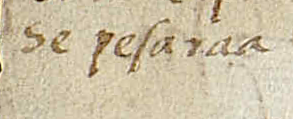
se pesaraa
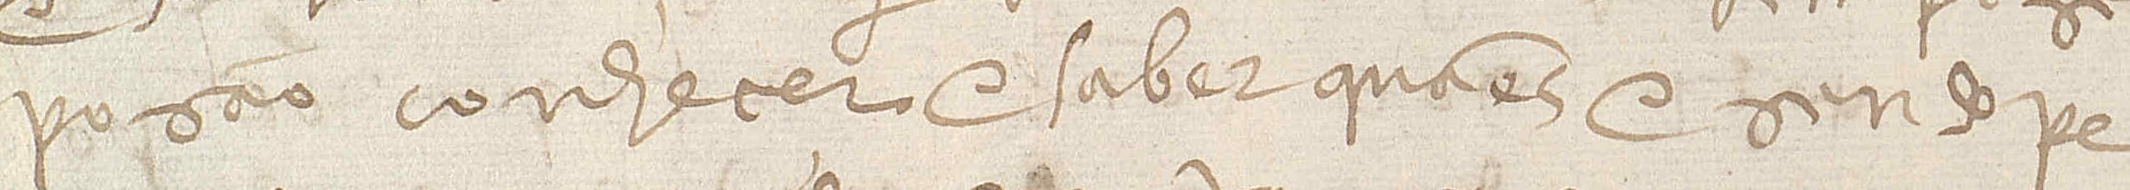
posão conhecer e saber quāes e sendo pe
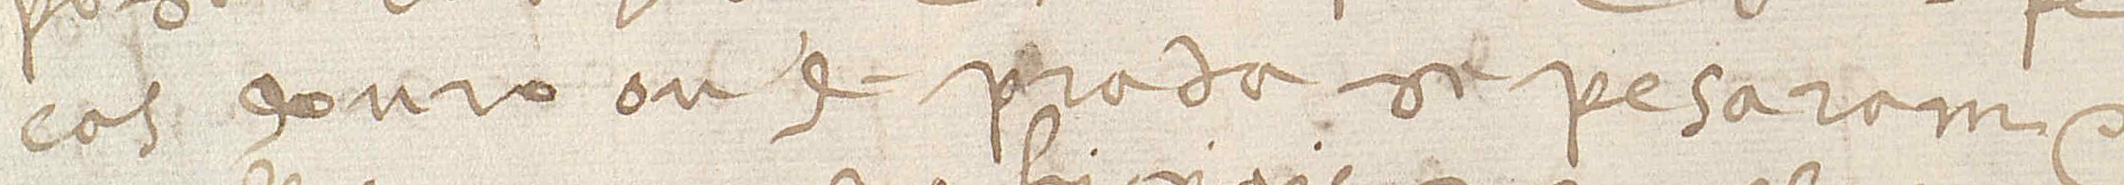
ças douro ou de prata se pesaram e
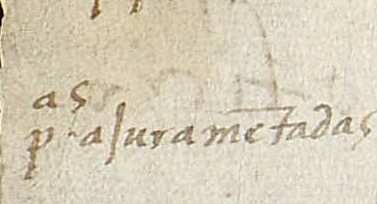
pas aJuramētadas
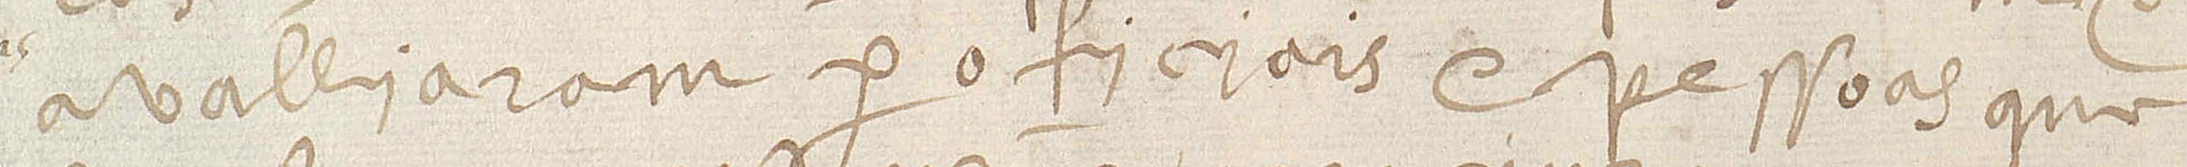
avallyaram ꝑ ofycyais e pessoas que
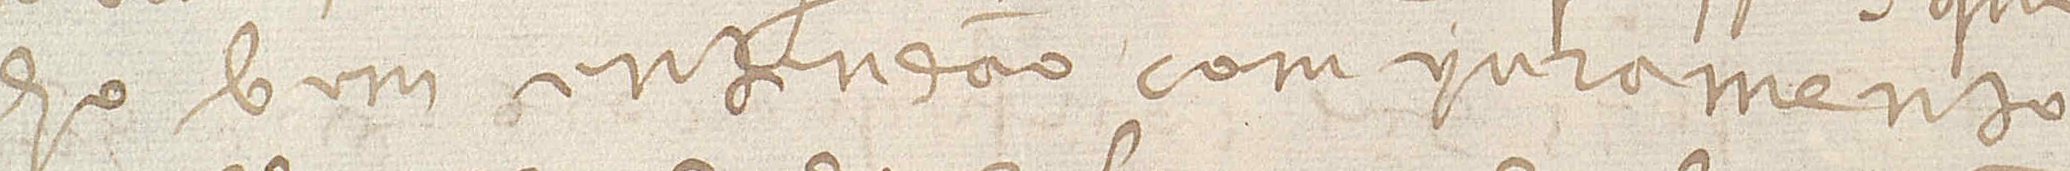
ho bem entendão com yuramento
